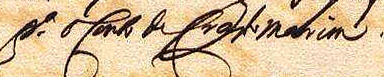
p.a o Couto de Crasto marim.
